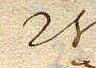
28
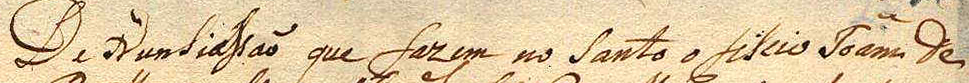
DeN̄unsiassaõ que fazem no santo ofiscio Ioam De
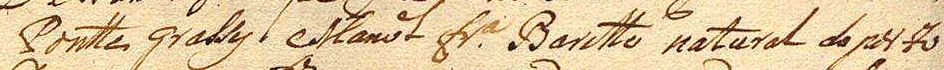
Pontte Grasses e Manoel fr.a Baretto natural do porto
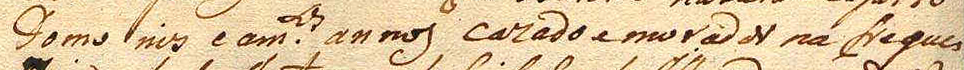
Do monis e a m.tos annos cazado e morador na fregue
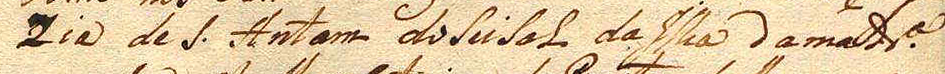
Zia de S. Antam do SeisaL da Jlha da madr.a
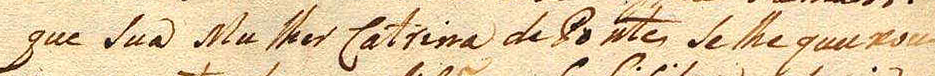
que sua Mulher Catrina de Ponte se lhe queixou
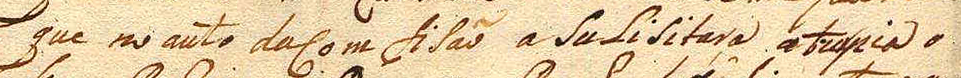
que no auto da Comfisaõ a Sulisitara a turpia o
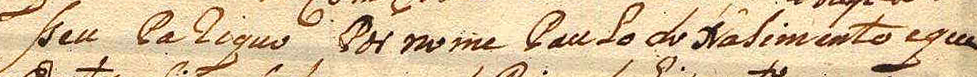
sseu PaRiquo Por nome Paulo do Nasimento e que
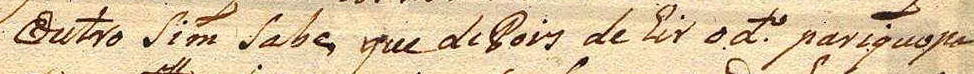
Outrosim sabe que dePois de hir o d̄.o pariquo pa
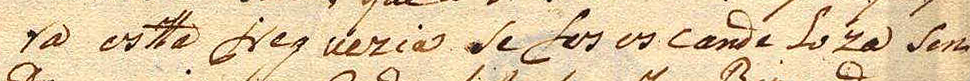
ra estta freguezia se fes escandeLoza sen
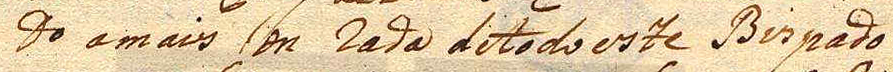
Do a mais onRada de todo este Bispado
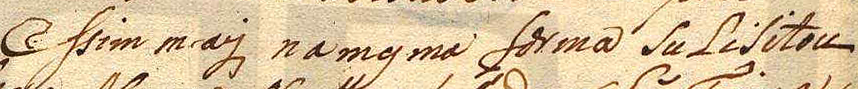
Assim mais na mesma forma sulisitou
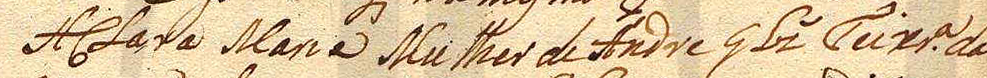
A CLara Maria Mulher de Andre Glz̄ Teixr.a da
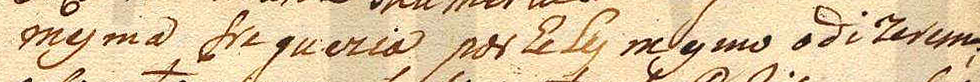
mesma freguezia por heles mesmo o dizerem
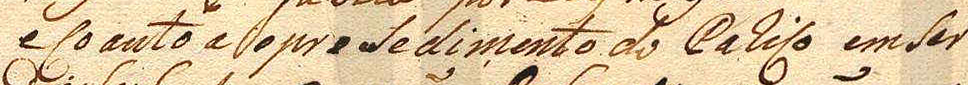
e Coanto ao prosedimento do PahiCo em ser
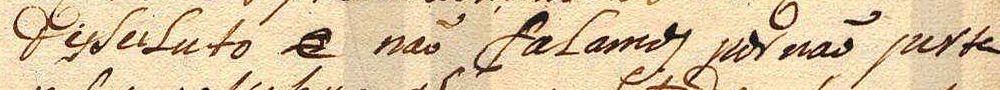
DissuLuto e naõ faLamos por naõ parta
